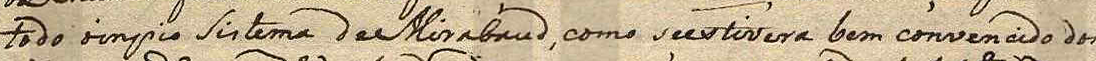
todo o inpio sistema de Mirabaud, como se estivera bem convencido dos
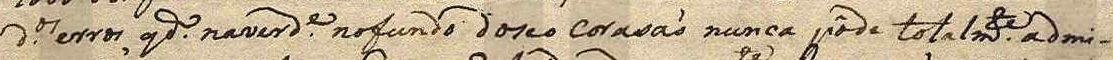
d.os erros, qd.o na verd.e no fundo do seo corasaõ nunca pôde totalm.te admi
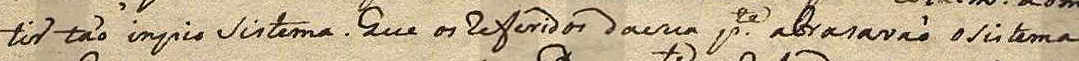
tir tão inpio sistema. Que os Referidos da sua p.te abrasavaõ o sistema
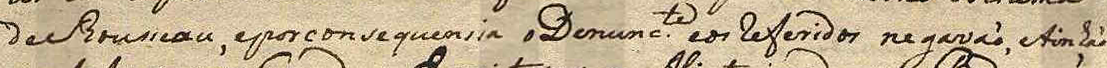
de Rousseau, e por consequensia o Denunc.te e os Referidos negavaõ, e tinhaõ
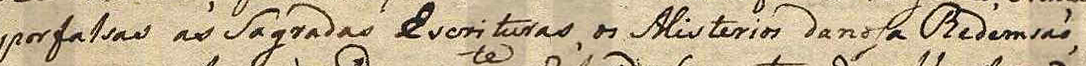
por falsas as Sagradas Escrituras, os Misterios da nosa Redemsaõ
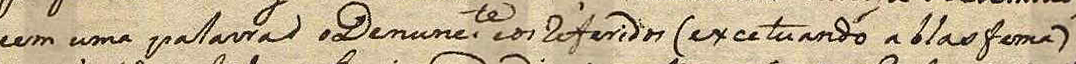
com uma palavra o Denunc.te e os Referidos (excetuando a blasfema)
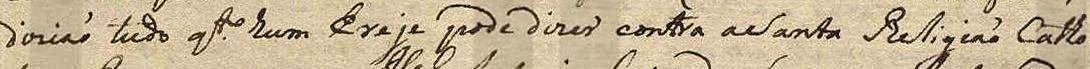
diziaõ tudo q.to hum Ereje pode dizer contra a Santa Religiaõ Catho
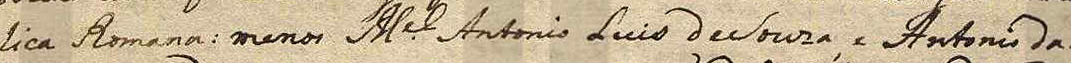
lica Romana: menos M.el Antonio Luis de Souza, e Antonio da
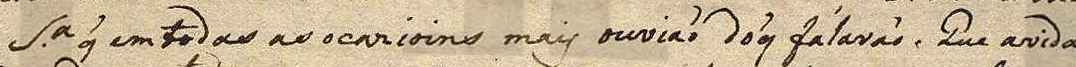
S.a q̄ em todas as ocazioins mais ouviaõ do q̄ falavaõ. Que a vida
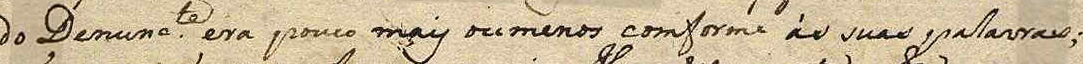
do Denunc.te era pouco mais ou menos comforme às suas palavras;
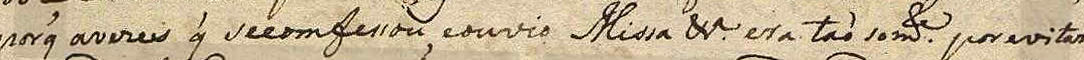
porq̄ a vezes q̄ se comfessou, e ouvio Missa &r.a era taõsom.te por evitar
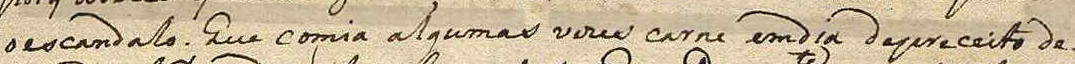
o escandalo: Que comia algumas vezes carne em dia de preceito de
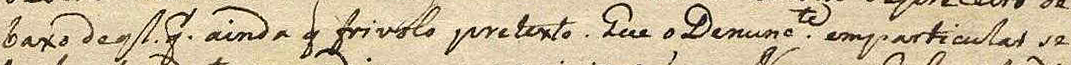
baxo de q̄l.qr. ainda q̄ frivolo pretexto. Que o Denunc.te em particular se
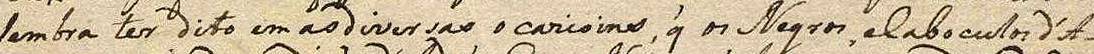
lembra ter dito em as diversas ocazioins, q̄ os Negros, e Caboculos d'A
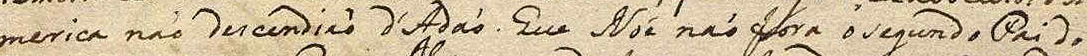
merica nao descendiaõ d'Adaõ. Que Noé naõ fora o segundo Pai do
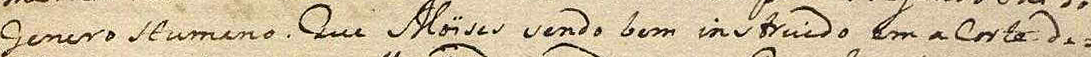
Genero Humano. Que Moises sendo bem instruido em a Corte de
